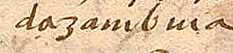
dazambuia
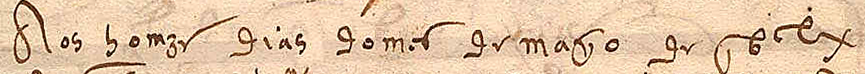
Aos homze dias do mes de mayo de jbc lx
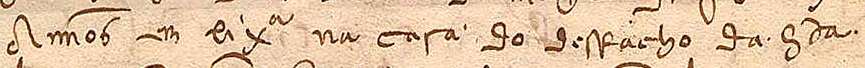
Ann̄os em lixa na casa do despacho da Sta.
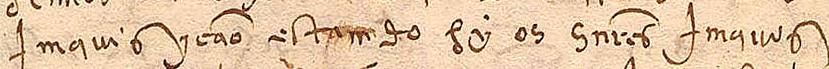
Jmquisyção estamdo hy os snr̄es Jmquisy
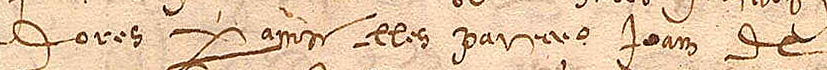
dores ꝑamte elles pareceo Joam de
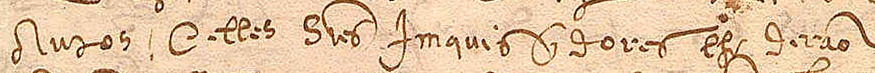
Autos / e elles sr̄es Jmquisydores lhe derão
